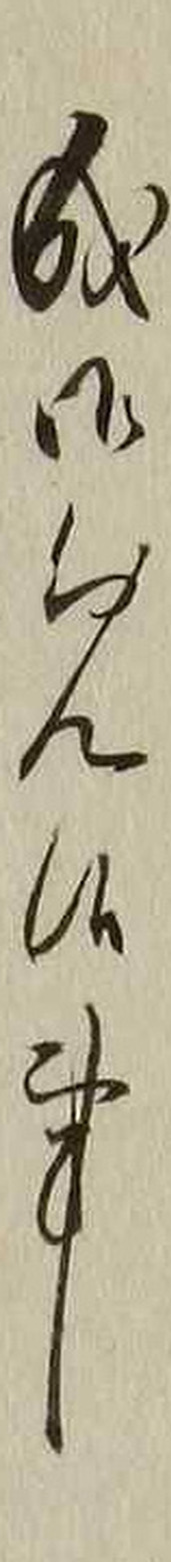成御免候事
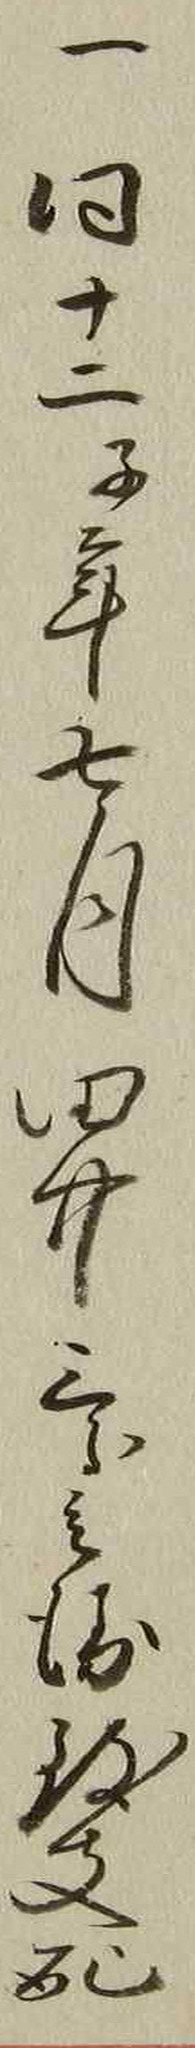一同十二子年七月田中三郎兵衛致支配
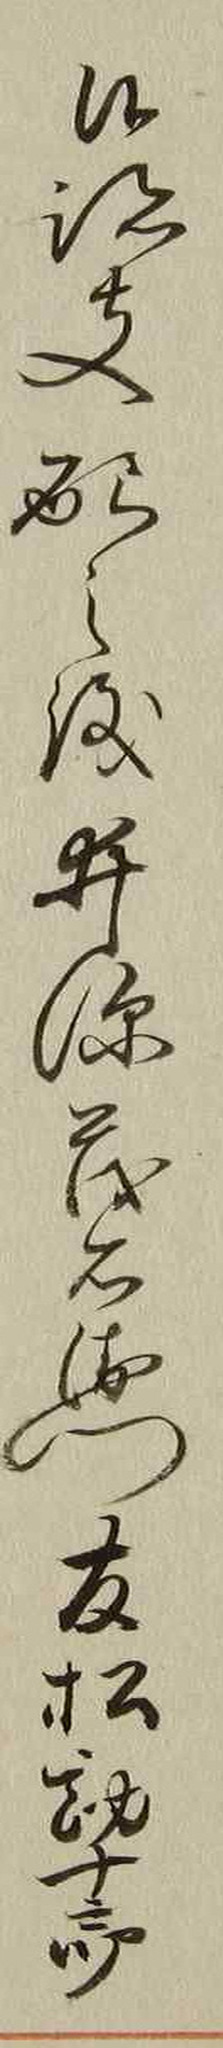候跡支配之儀井深源石衛門友松勘十郎
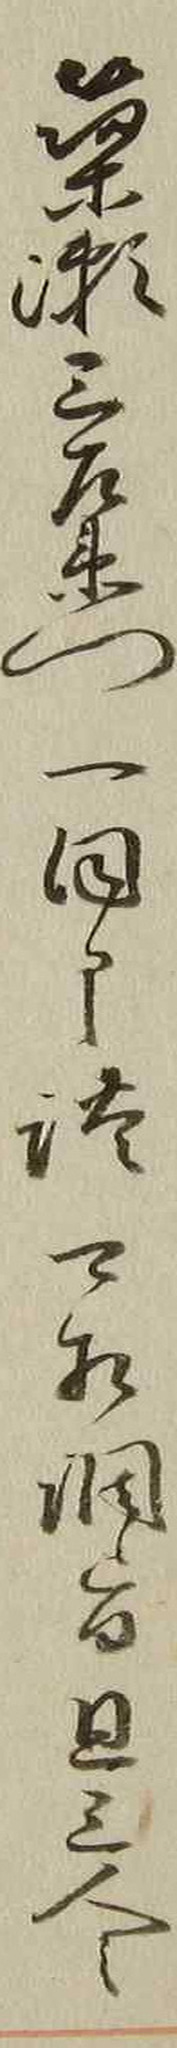簗瀬三左衛門一同申談可相調旦三人之
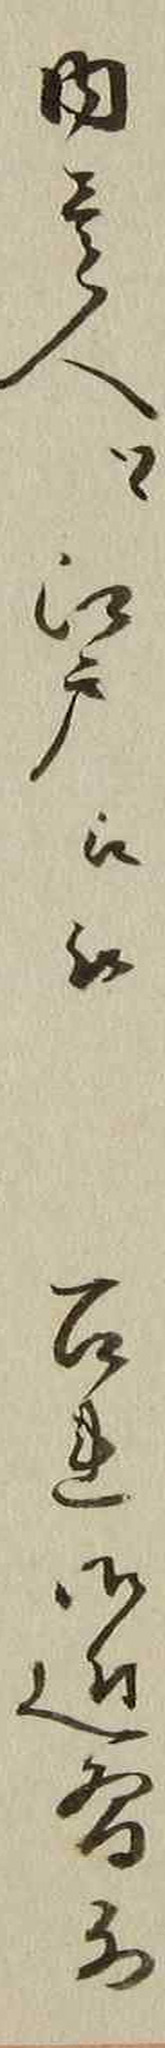内壱人ツヽ江戸江被召連御近習別
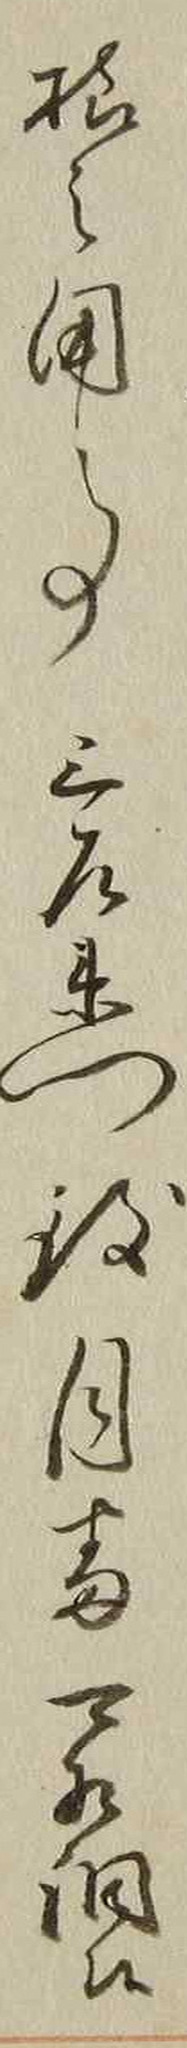様之用事三左衛門致月番可相調候
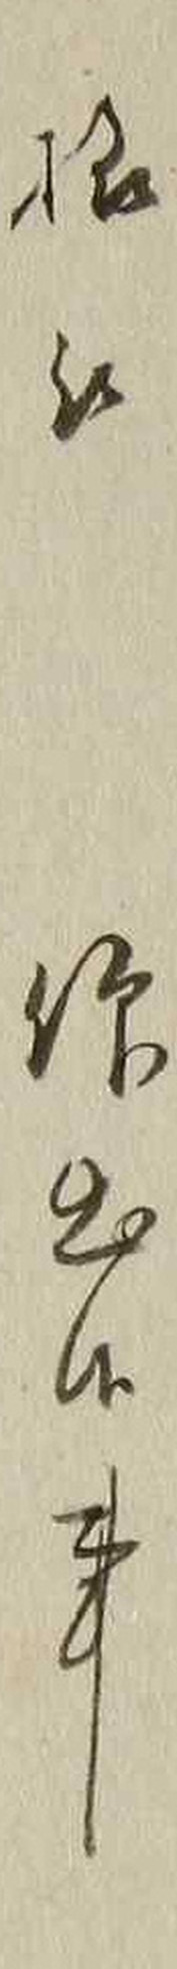様被仰出候事
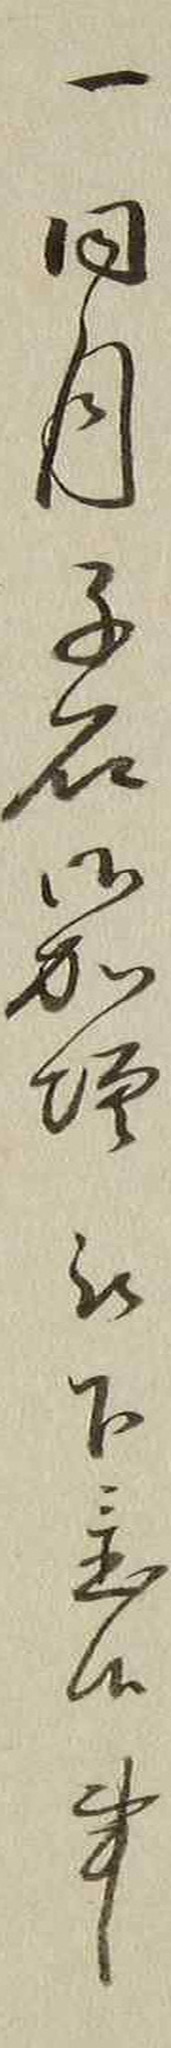一同月千石御加増被下置候事
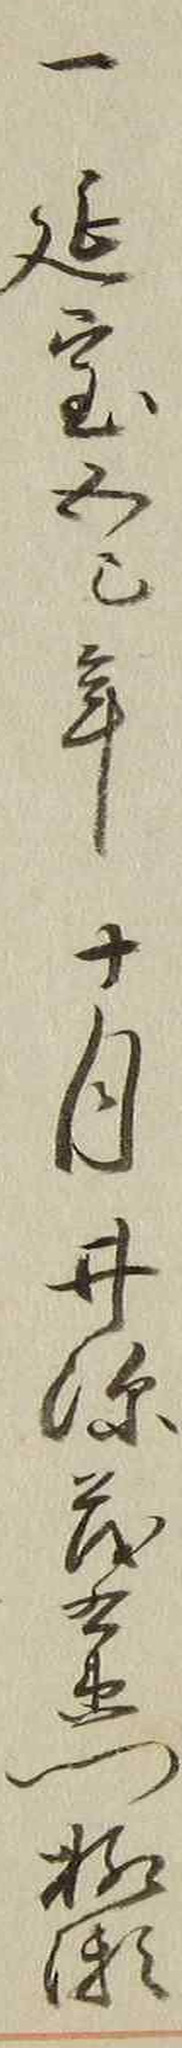一延宝五巳年十月井深茂右衛門柳瀬
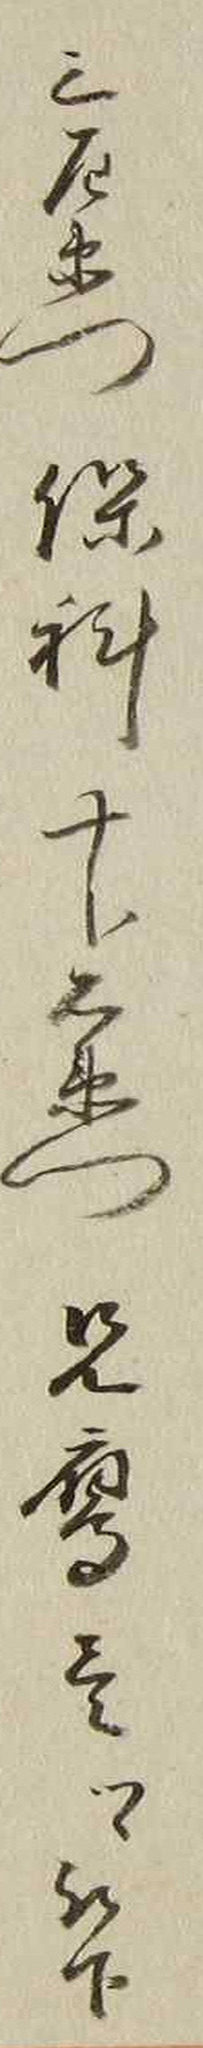三左衛門保科十郎右衛門兄鷹壱つヽ被下
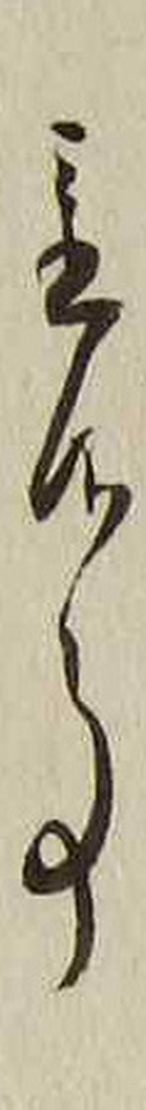置候事
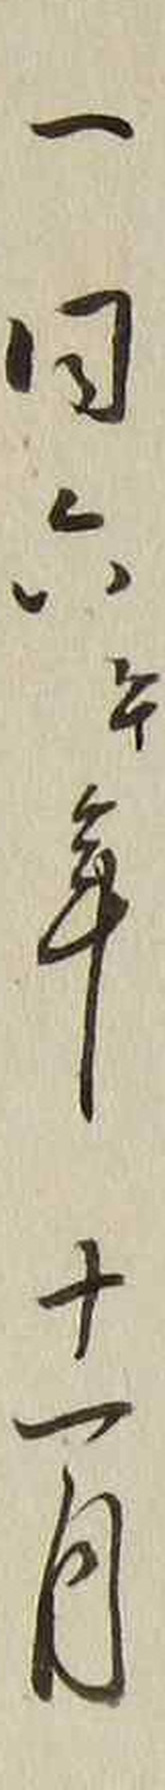一同六午年十月
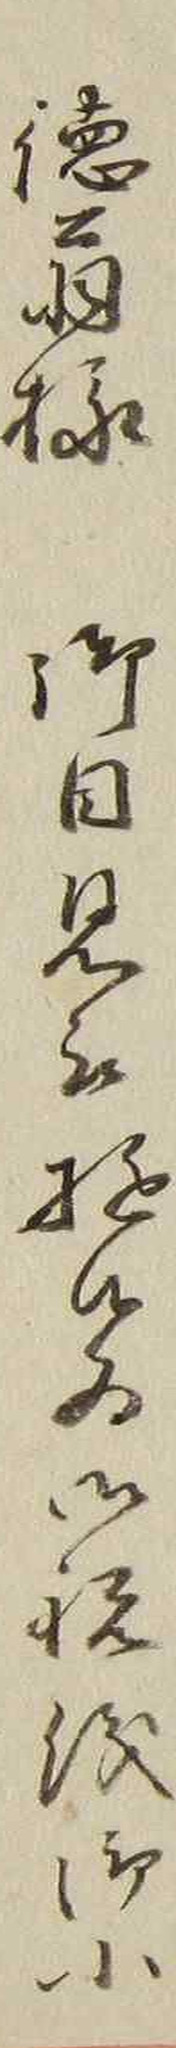徳翁様御日見被遊候為御祝儀御小

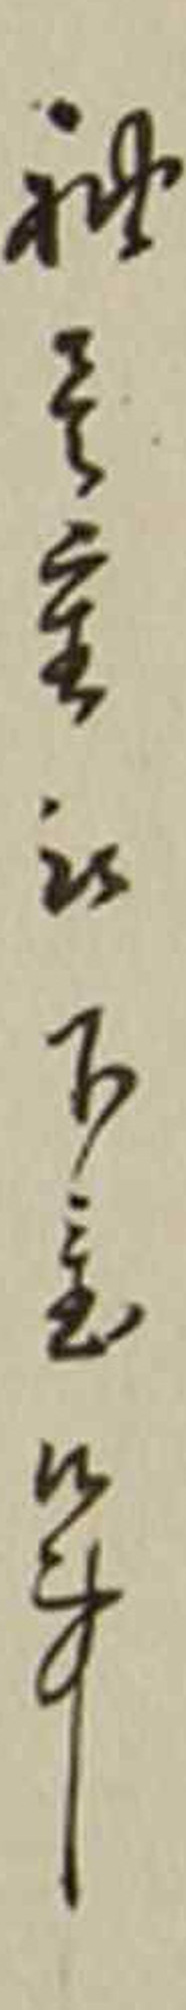袖壱重被下置候事
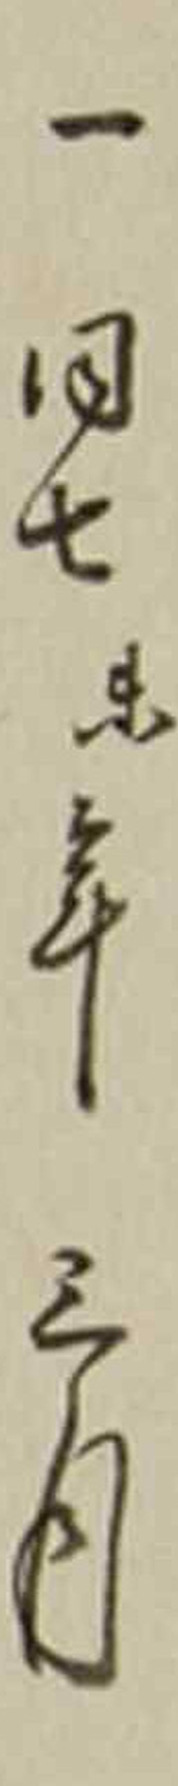一同七未年三月
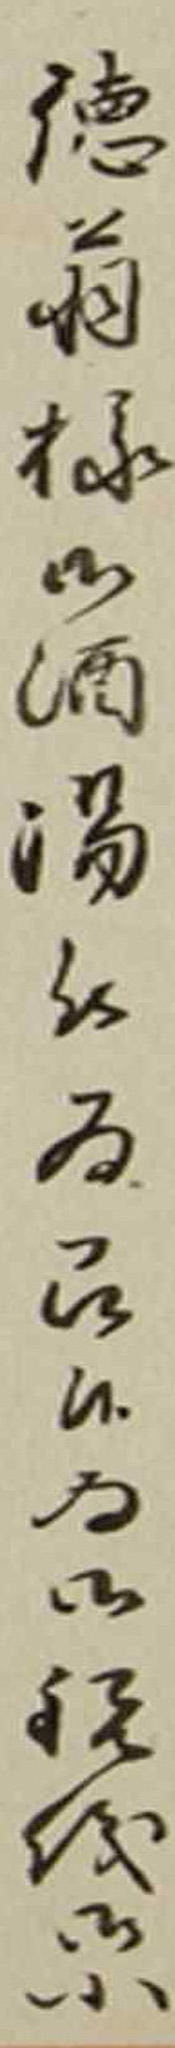徳翁様御酒湯被為召候為御祝儀御小
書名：諸士系譜　巻之204　や之部1
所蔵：会津若松市立会津図書館
